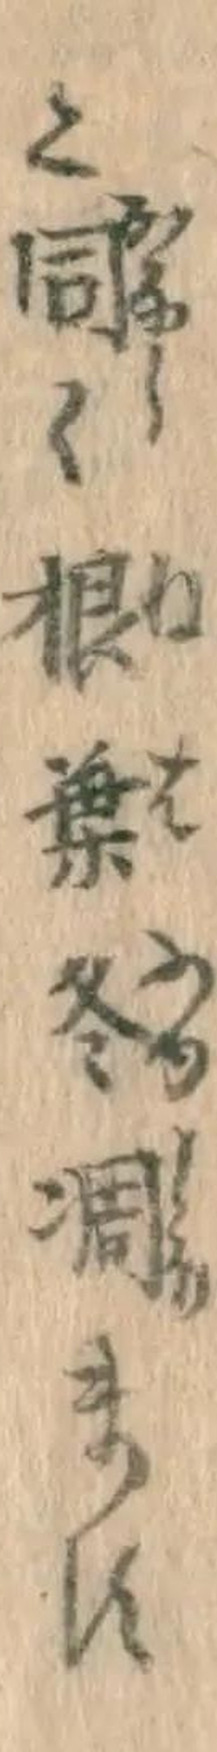と同く根葉冬凋ます
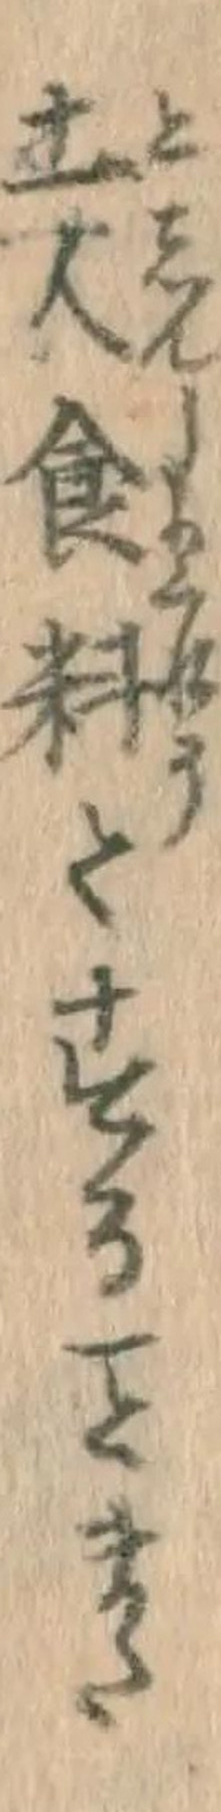土人食料とすることまた
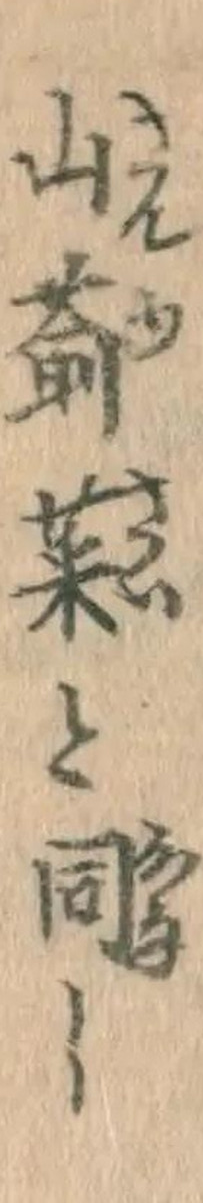山萮菜と同し

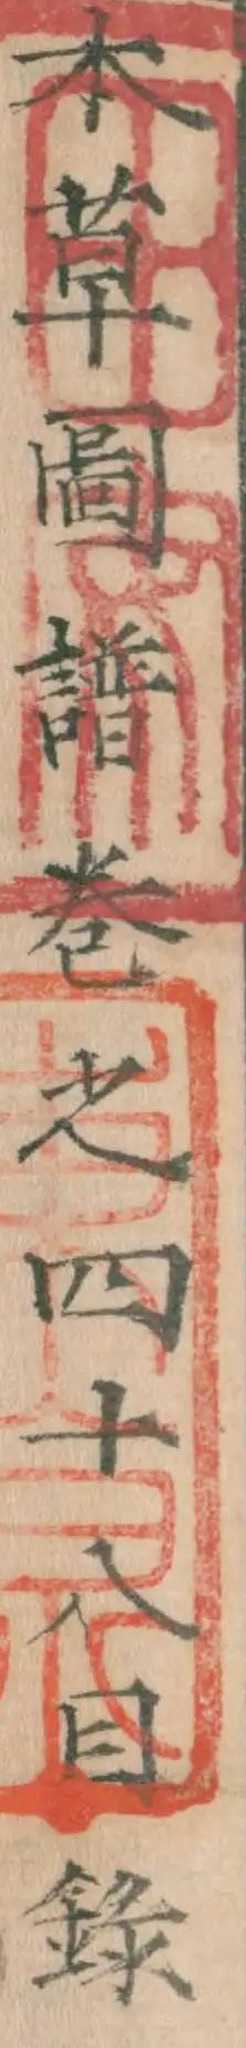本草図譜巻之四十八目録

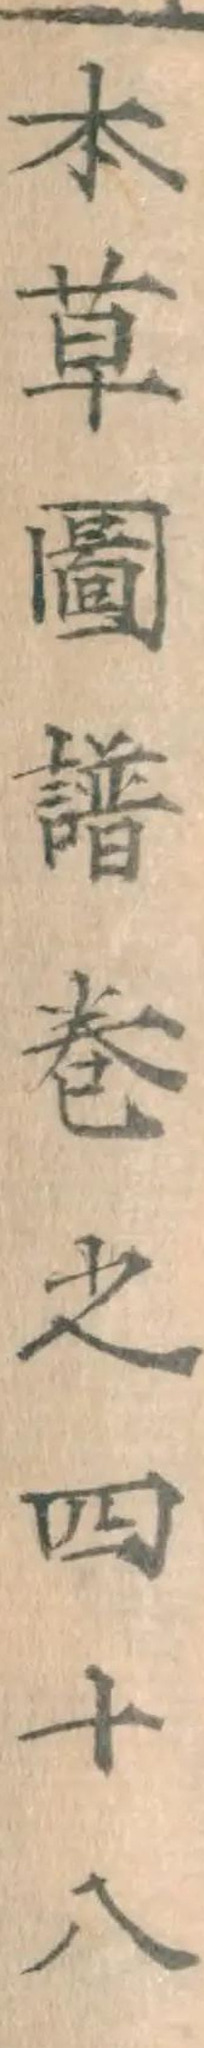本草図譜巻之四十八
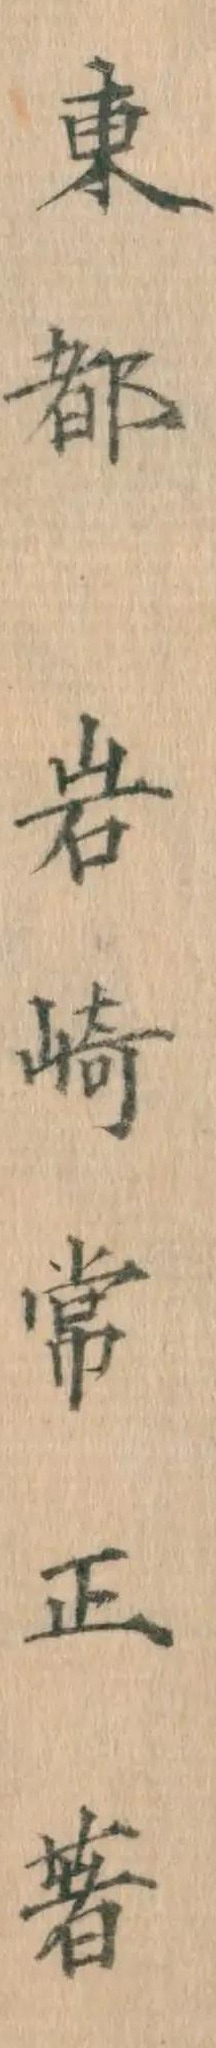東都岩崎常正著
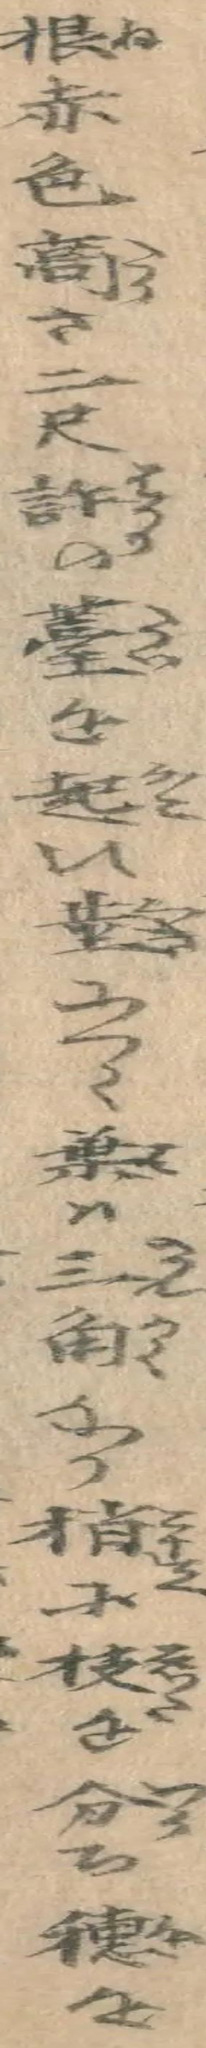根赤色高さ二尺許の薹を起す茎につく葉は三角なり梢に枝を分ち穂を
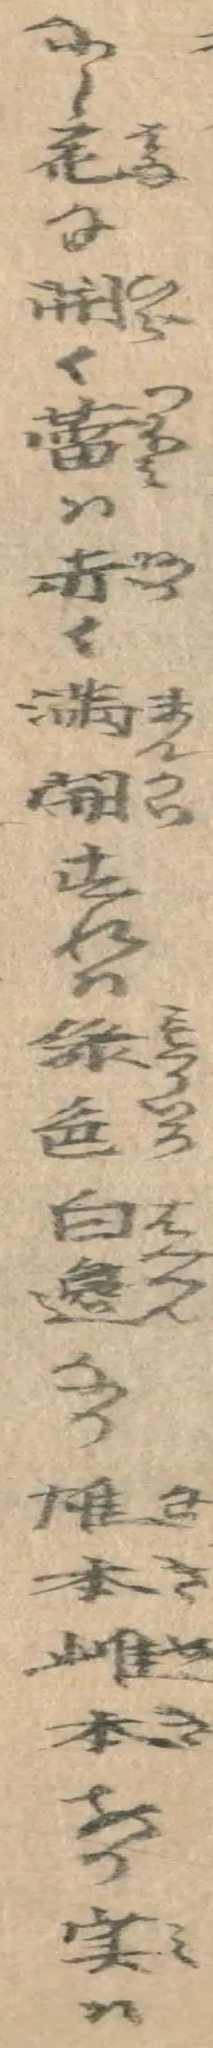なし花を開く蕾は赤く満開すれは緑色白辺なり雄本雌本あり実は
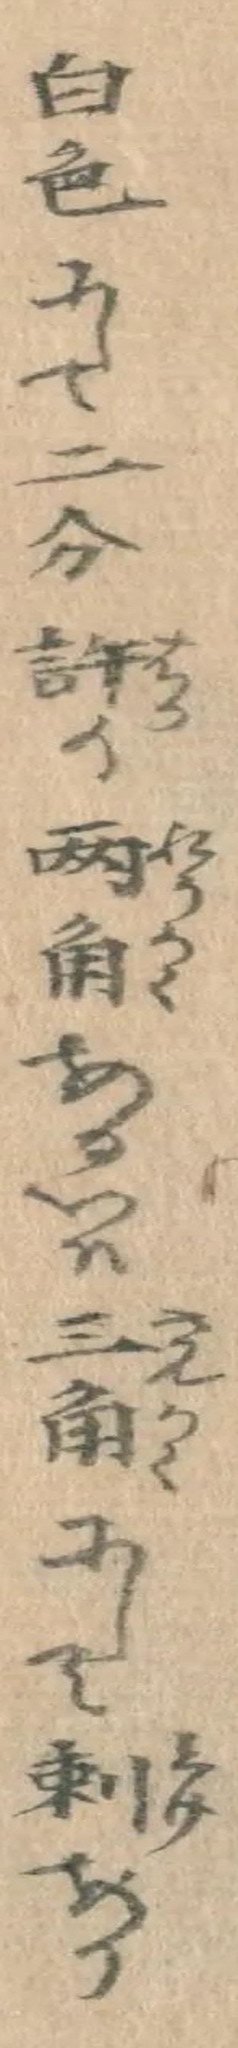白色にして二分許り両角あるいは三角にして剌あり

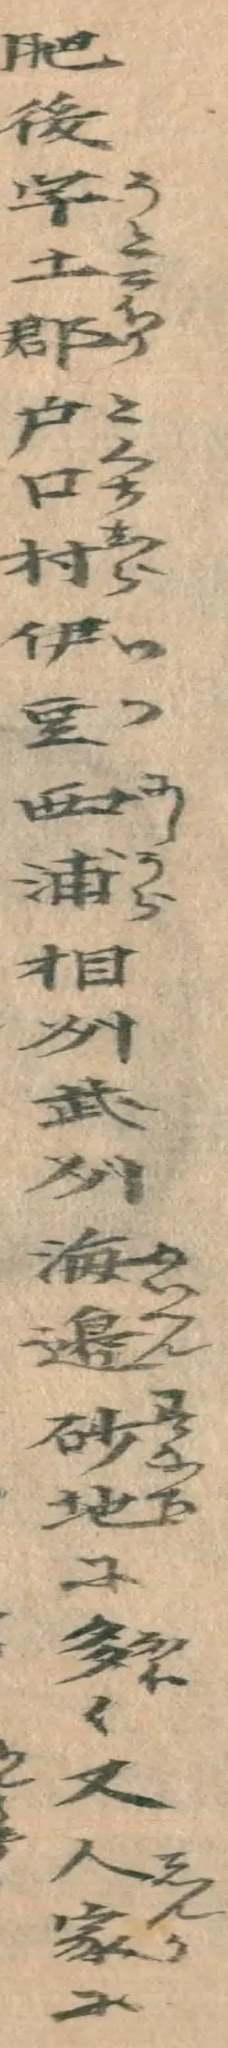肥後宇土郡戸口村伊豆西浦相州武州海辺砂地に多く又人家に
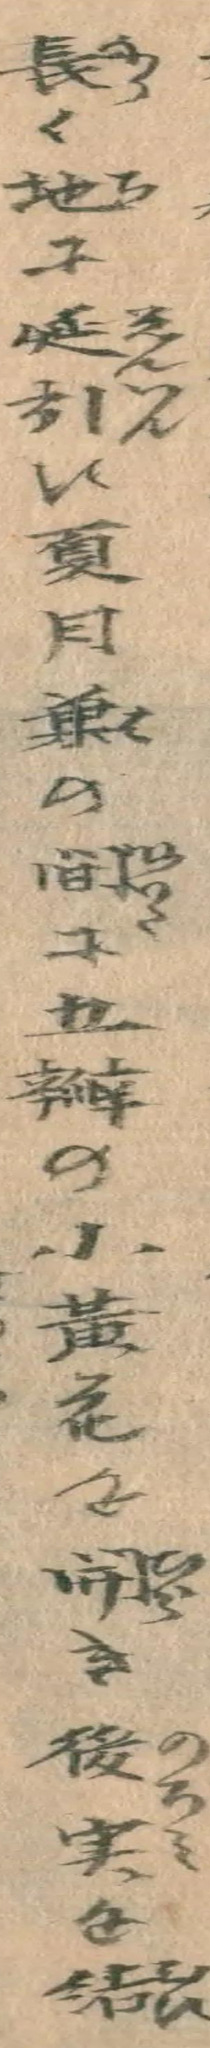長く地に延引す夏月葉の間に五弁の小黄花を開き後実を結
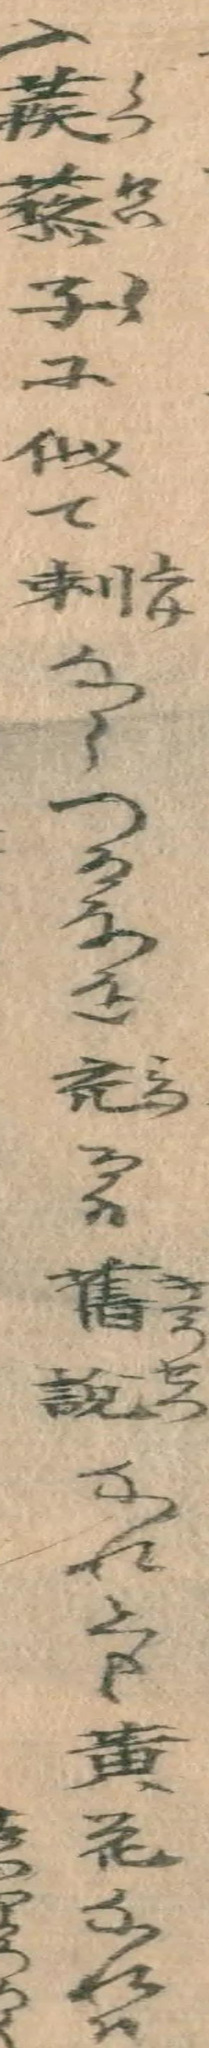ふ蒺藜子に似て剌なしつるなを充るは旧説なれとも黄花なれは
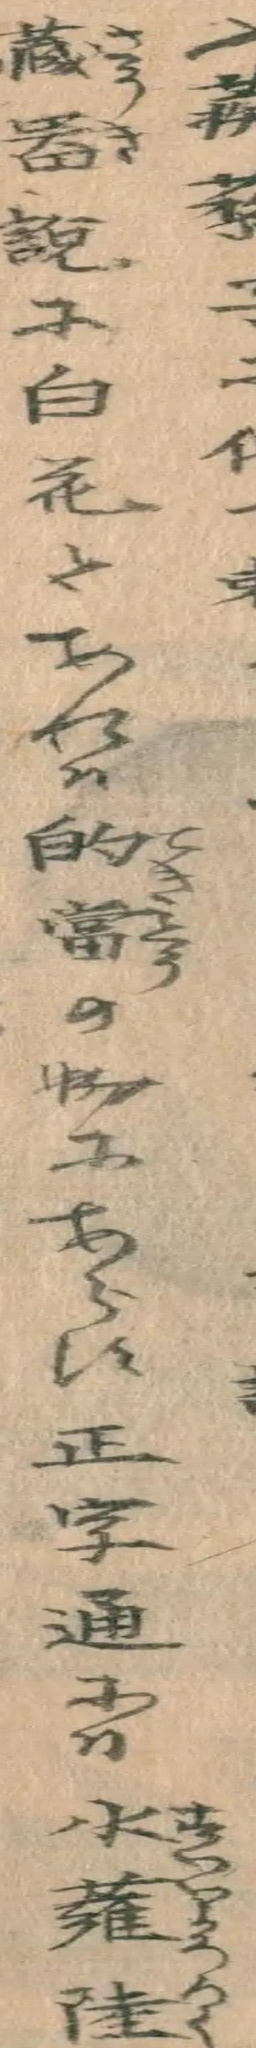蔵器説に白花とあれは的当の物にあらす正字通には水蕹陸
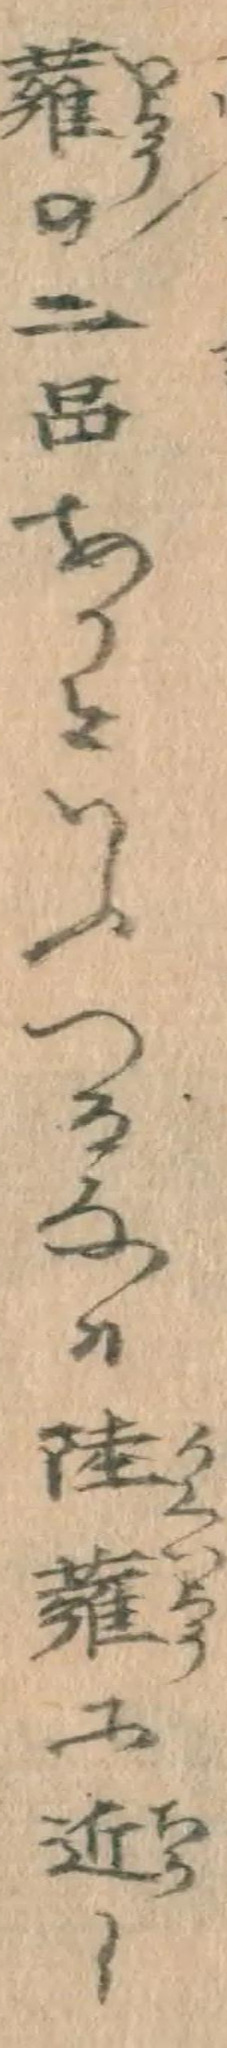蕹の二品ありといふつるなは陸蕹に近し

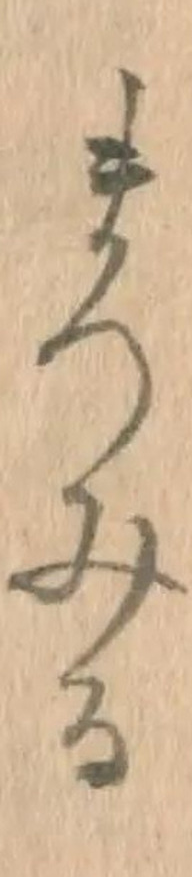まつみる
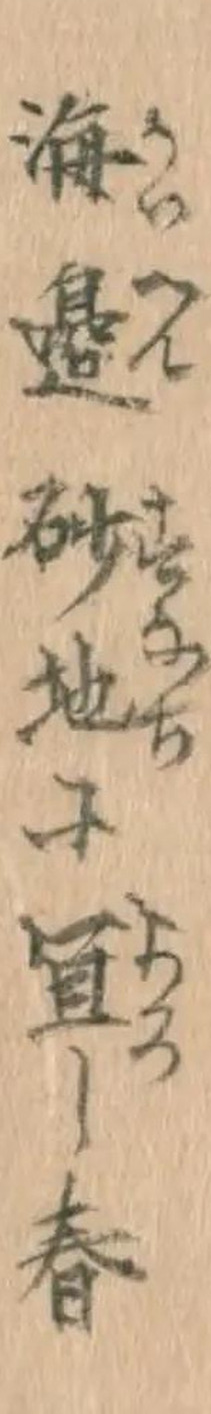海辺砂地に宜し春
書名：本草図譜. 巻46-48
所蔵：国立国会図書館 National Diet Library, JAPAN
